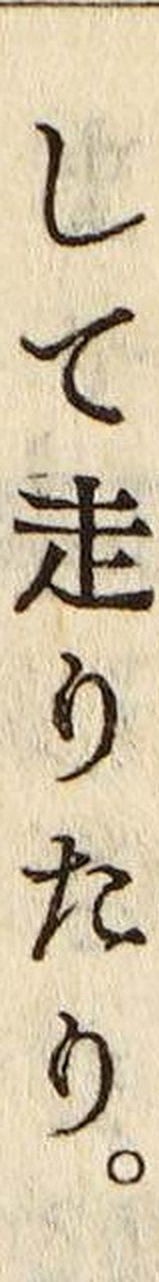して走りたり。
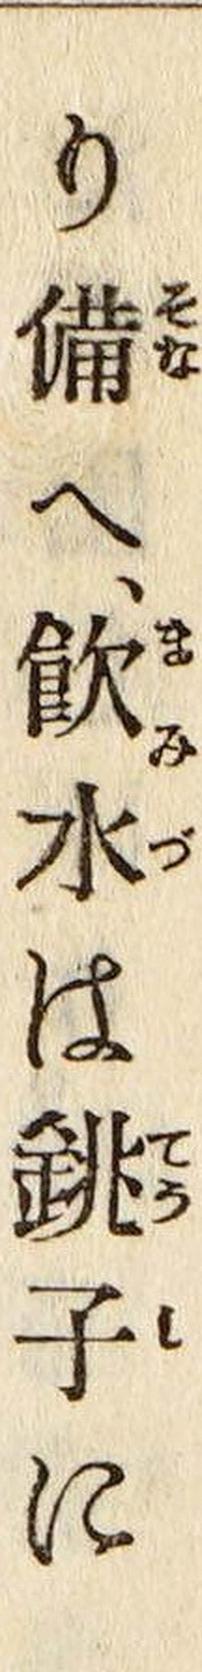り備へ、飲水は銚子に
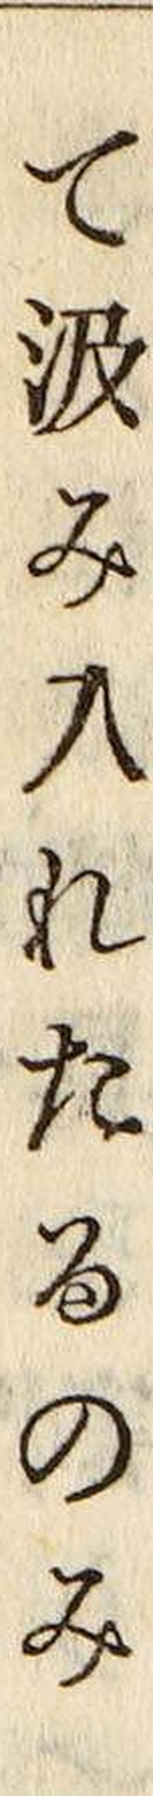て汲み入れたるのみ
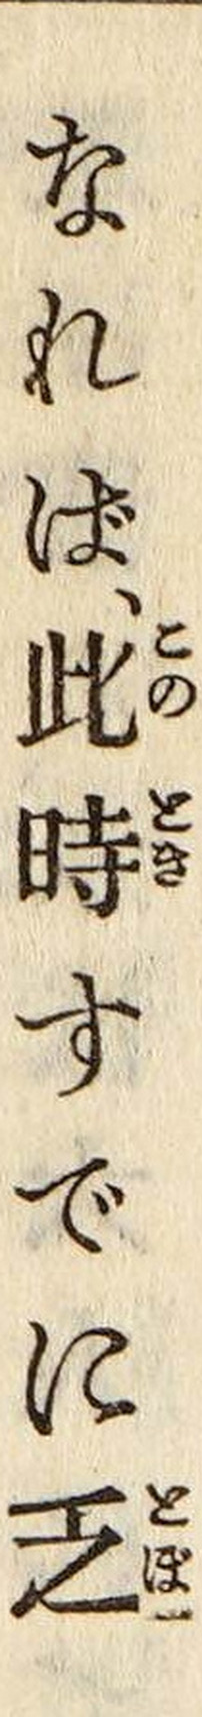なれば、此時すでに乏
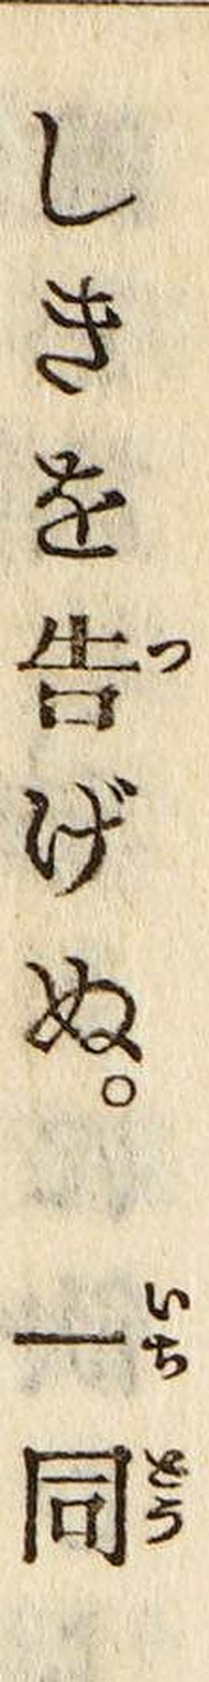しきを告げぬ。一同
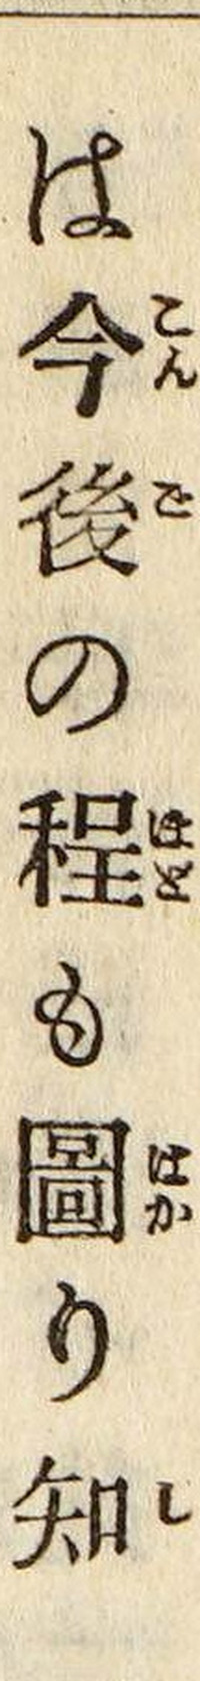は今後の程も図り知

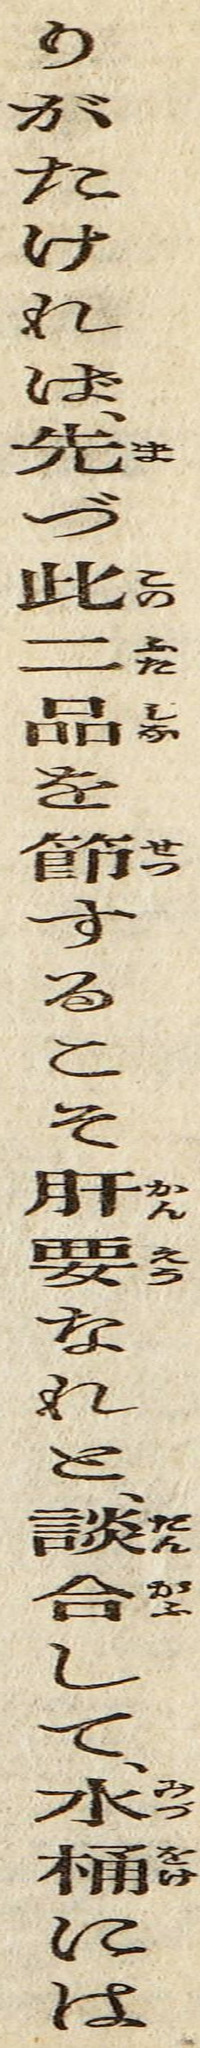りがたければ、先づ此二品を節するこそ肝要なれと、談合して、水桶には
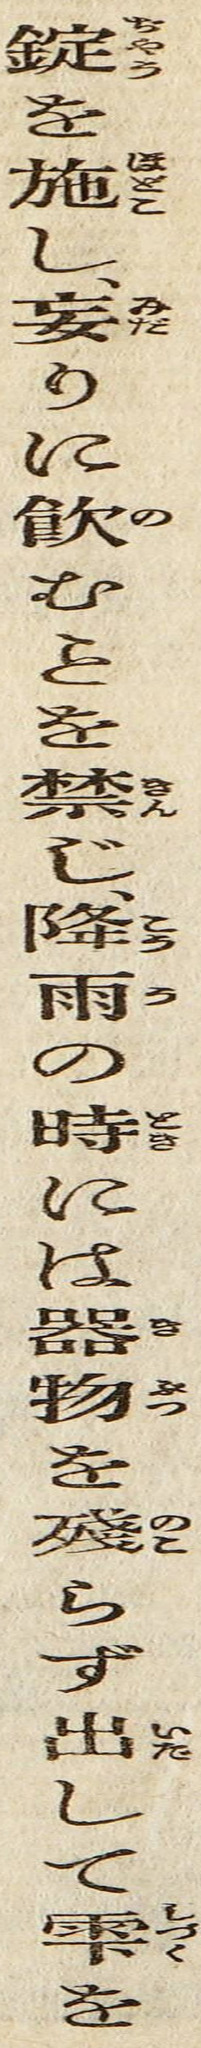錠を施し、妄りに飲むことを禁じ、降雨の時には器物を残らず出して雫を
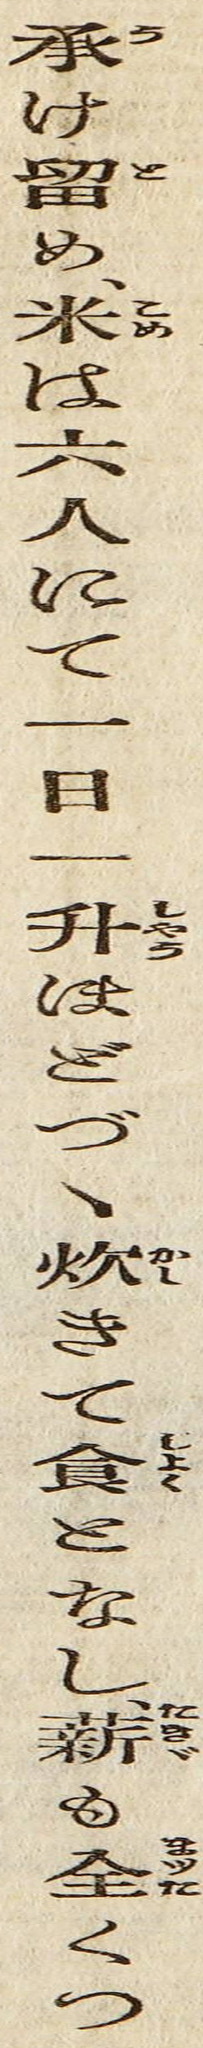承け留め、米は六人にて一日一升ほどづヽ炊きて食となし、薪も全くつ
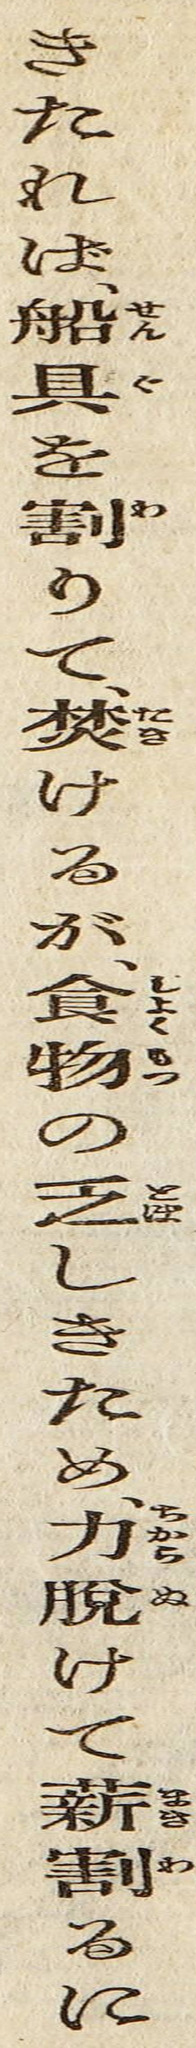きたれば、船具を割りて、焚けるが、食物の乏しきため、力脱けて薪割るに
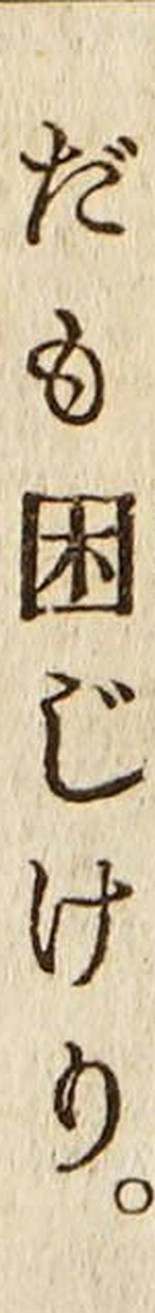だも困じけり。
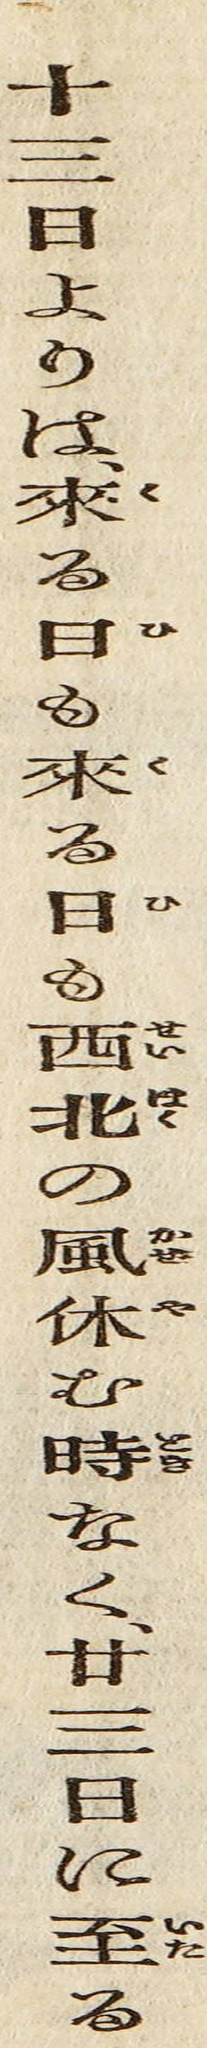十三日よりは、来る日も来る日も西北の風休む時なく、廿三日に至る
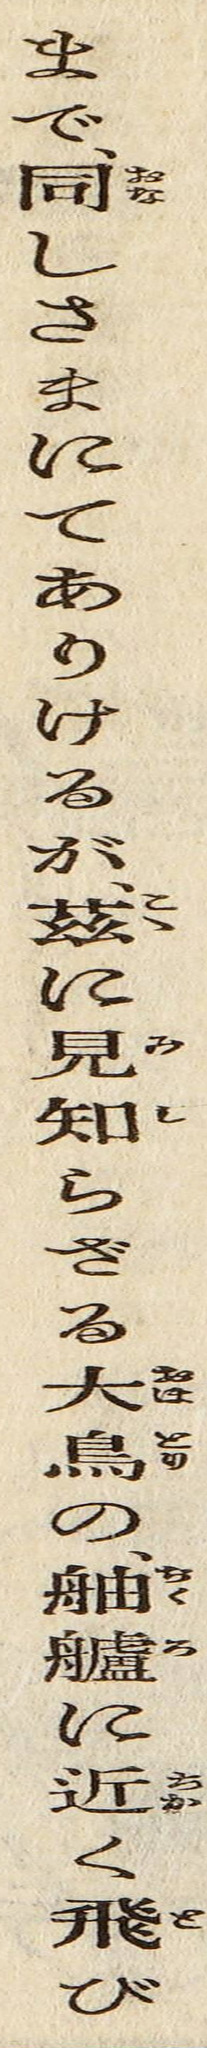まで、同しさまにてありけるが、茲に見知らざる大鳥の、舳艫に近く飛び
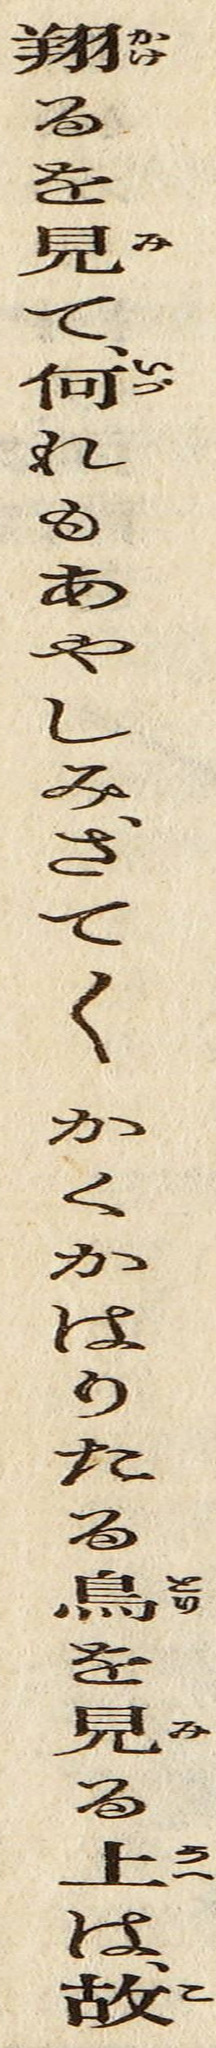翔るを見て、何れもあやしみ、さて〳〵かくかはりたる鳥を見る上は、故
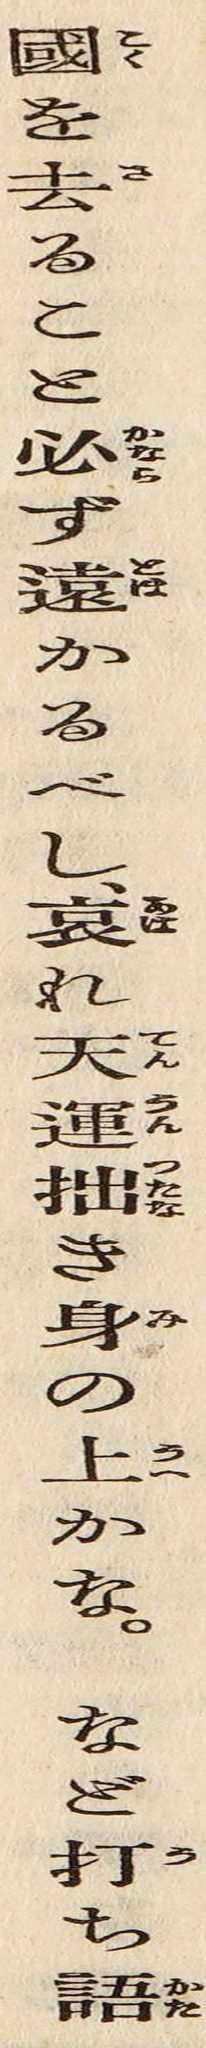国を去ること必ず遠かるべし、哀れ天運拙き身の上かな。など打ち語
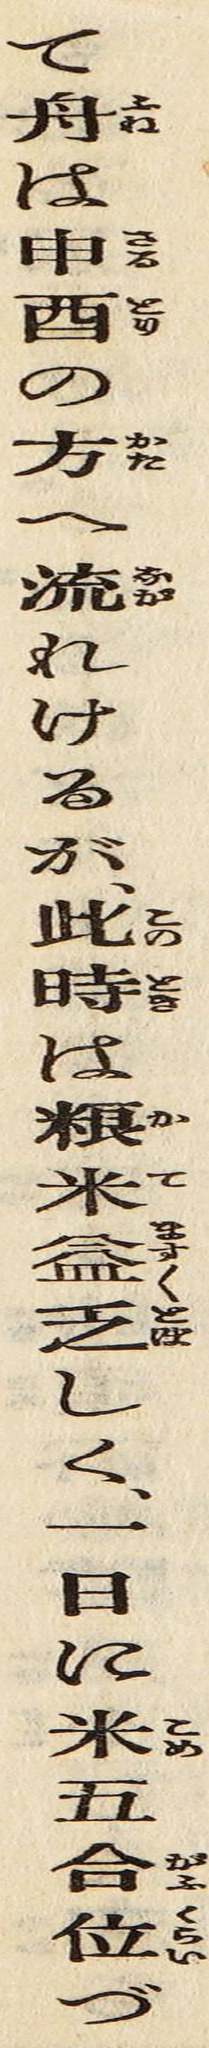て舟は申酉の方へ流れけるが、此時は糧米益乏しく、一日に米五合位づ
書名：日本漂流譚
